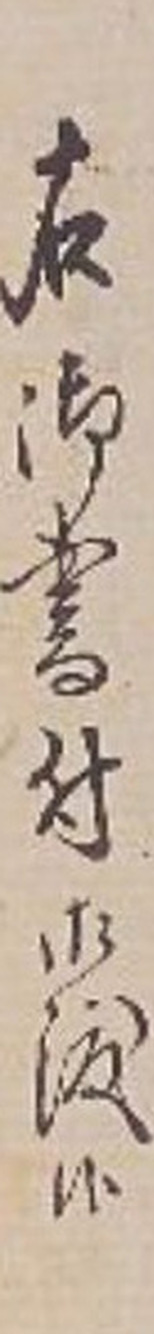右御書付御渡候
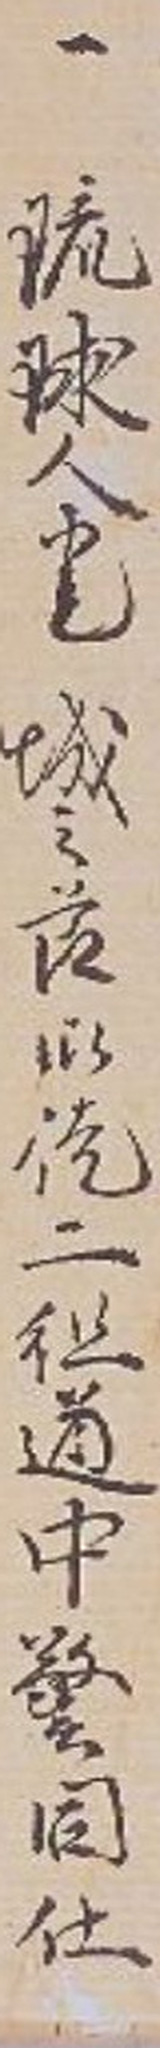一琉球人登城之節御徒二組道中警固仕
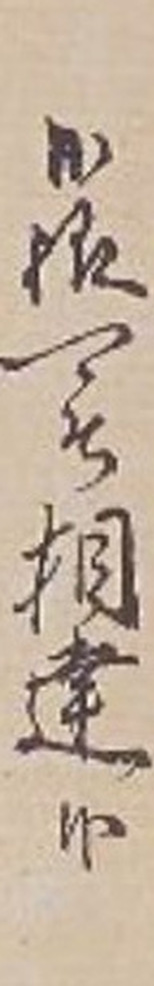候様可被相達候
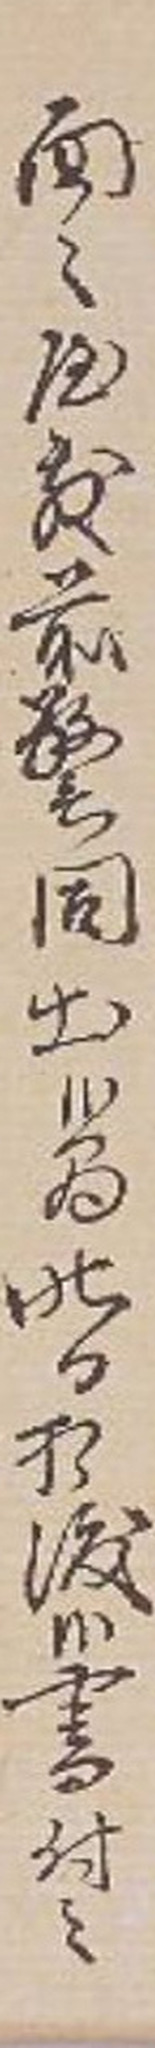面々屋敷前警固出候間昨日相渡候書付之
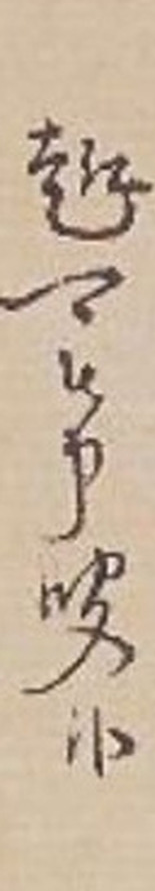趣可被申聞候
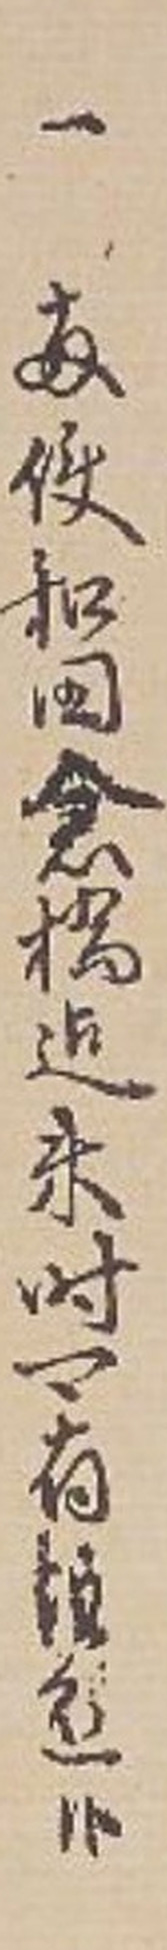一両使和田倉橋迄来時可有注進候
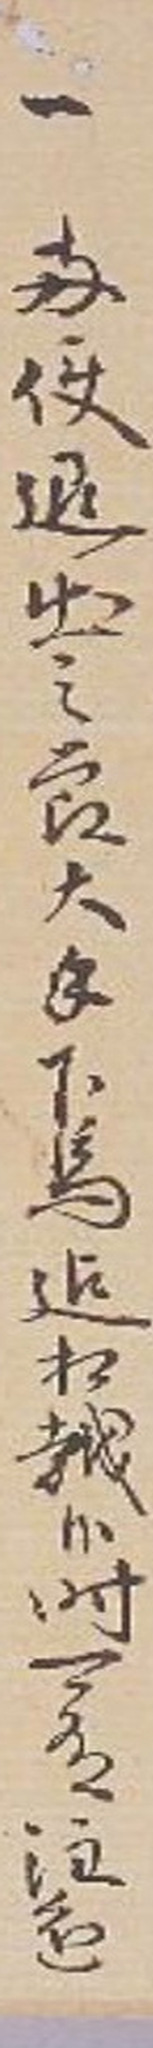一両使退出之節大手下馬迄相越候時可有注進
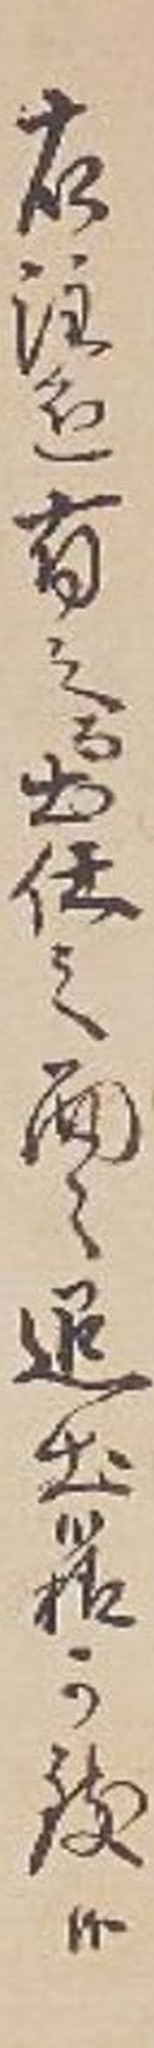右注進有之而出仕之面々退出候様可致候
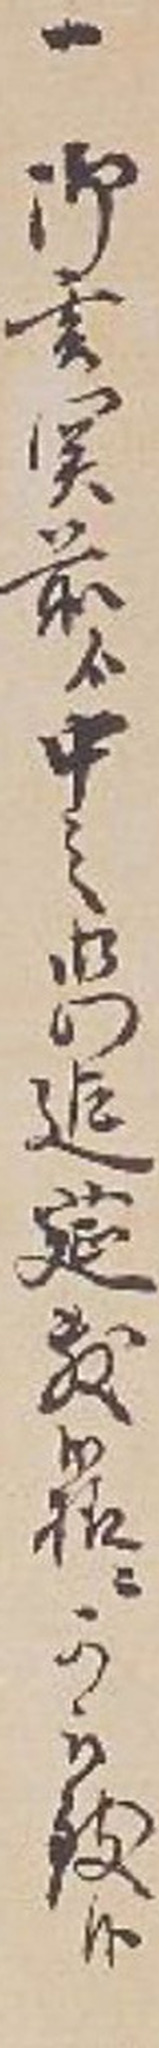一御玄関前ゟ中之御門迄莚敷候様に可被致候
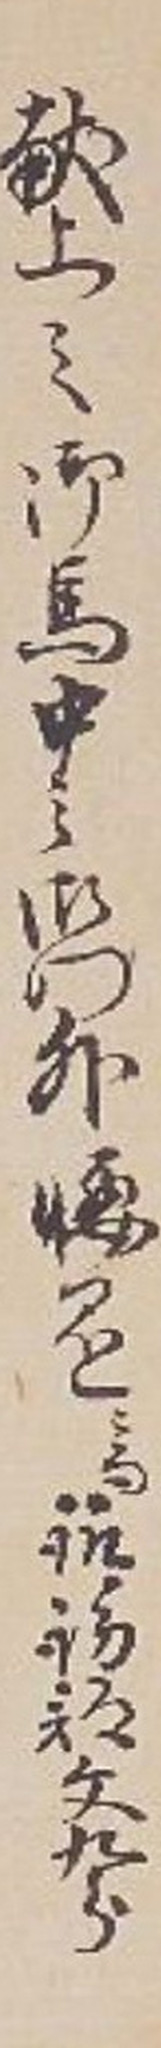献上之御馬中之御門外腰懸に而諏訪部文九郎
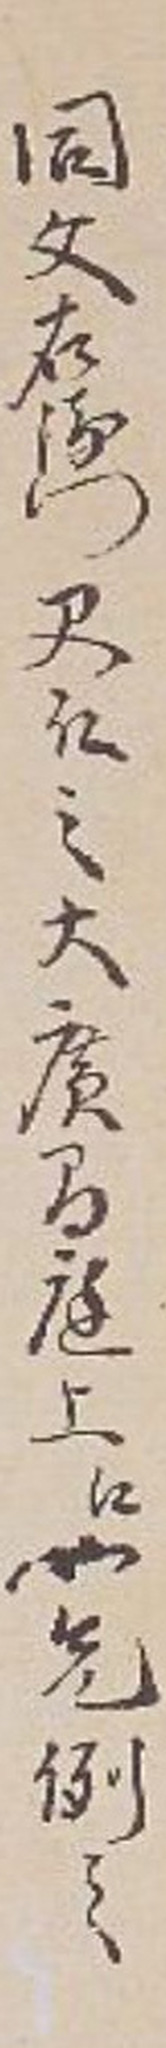同文右衛門受取之大広間庭上え如先例之
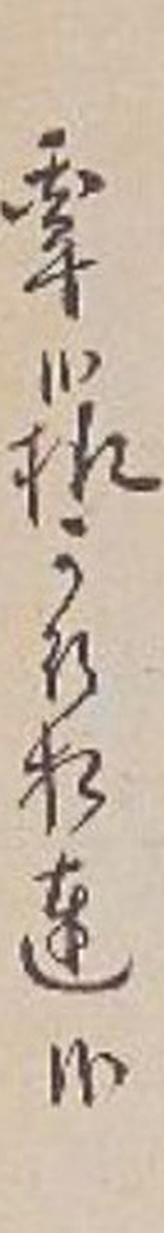牽候様可被相達候
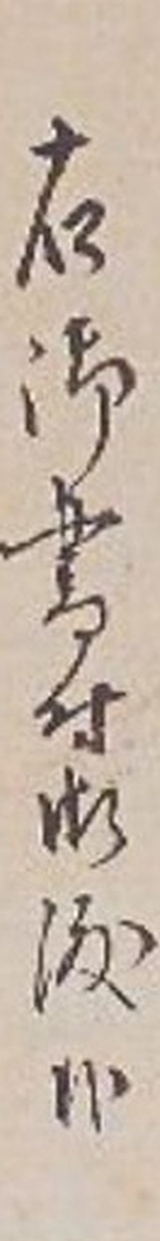右御書付御渡候
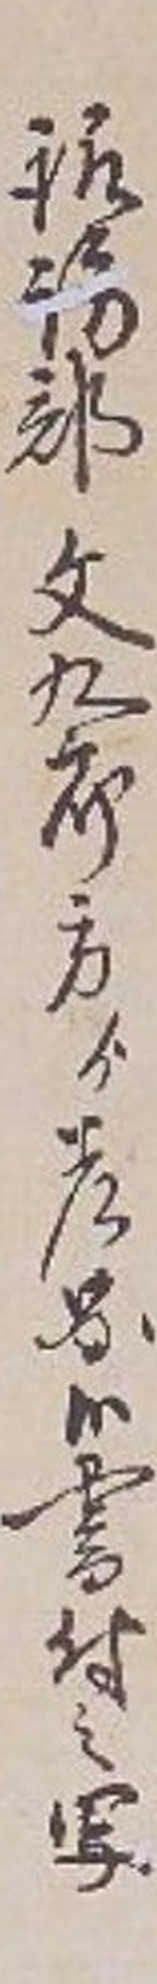諏訪部文九郎方ゟ差図候書付之写

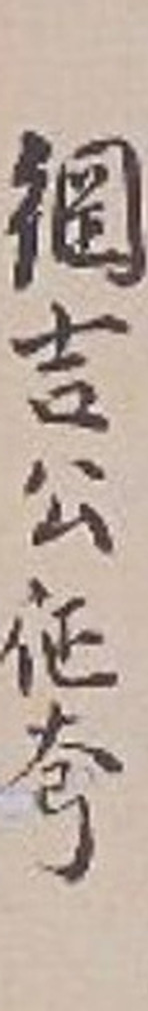綱吉公征夷
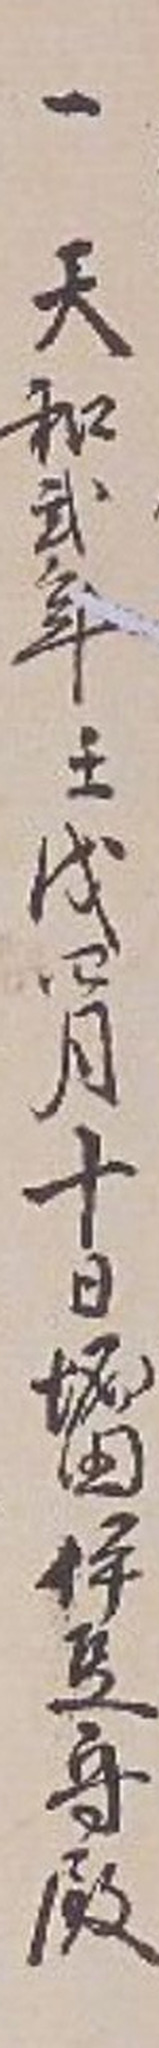一天和弐年壬戊四月十日堀田伊豆守殿
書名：宝永七年 琉球人来聘
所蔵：University of the Ryukyus Library
